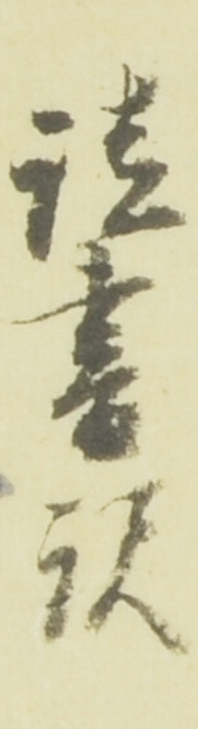諸書訳
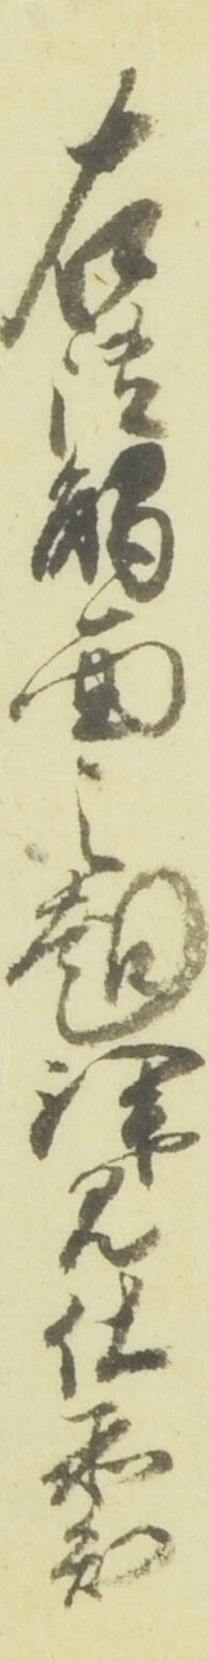右御触面之趣拝見仕承知
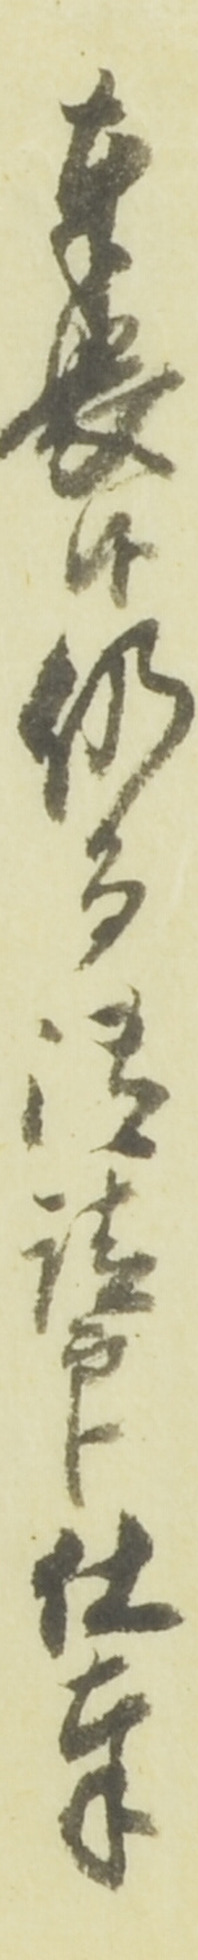奉畏候仍而御請印仕奉
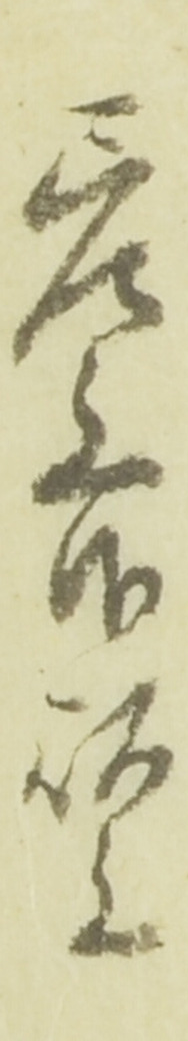差上候以上
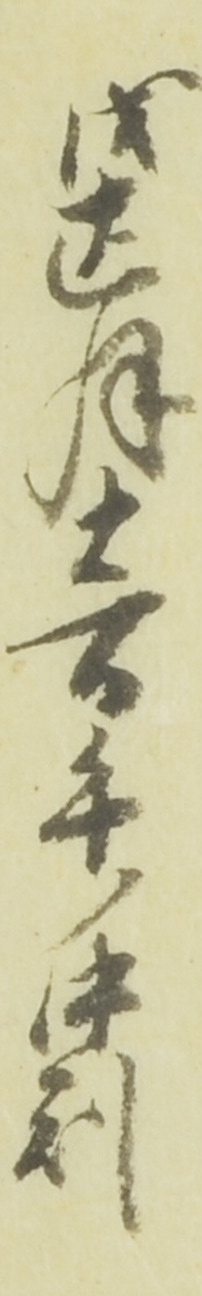戌正月十二日午ノ中刻
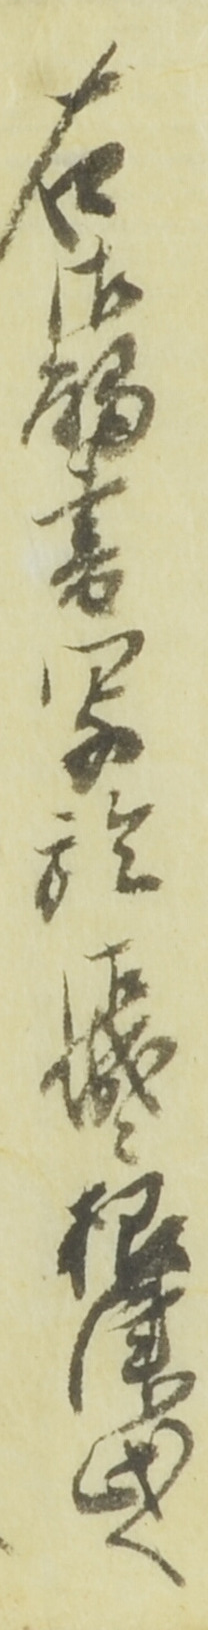右御触書写於御城ニ根津氏へ
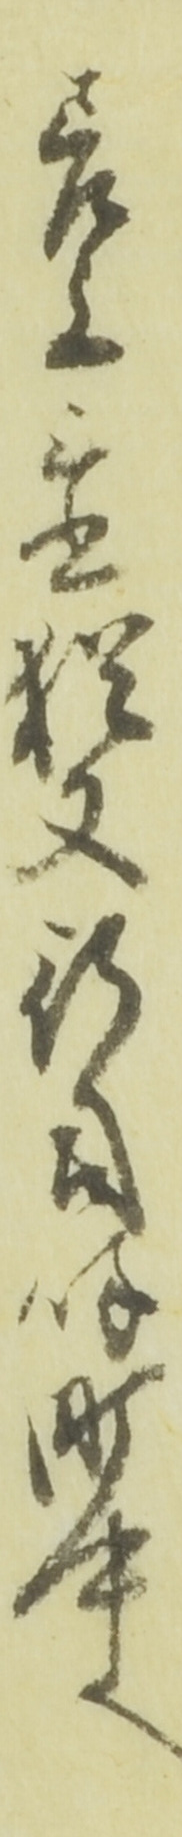差上置猶又行司呼町中へ
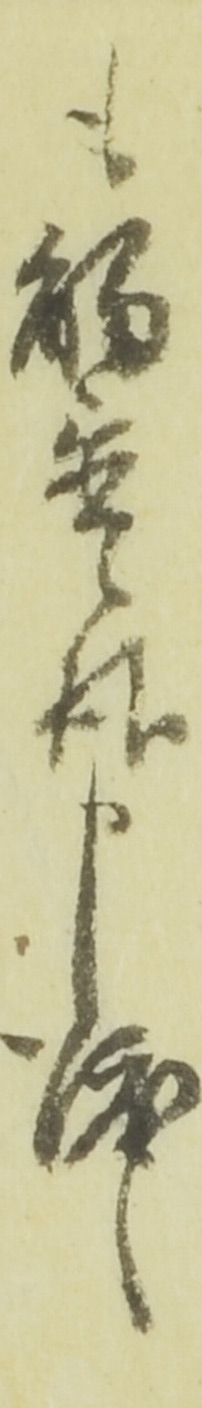も触置候様申渡候
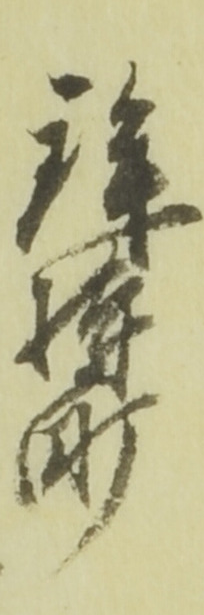鉾持町
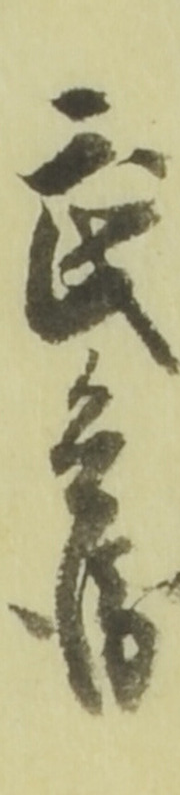武兵衛
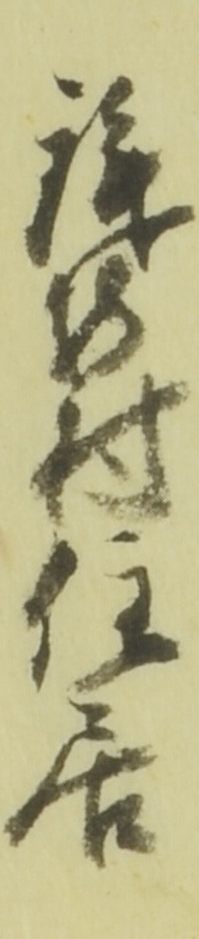鉾持村住居
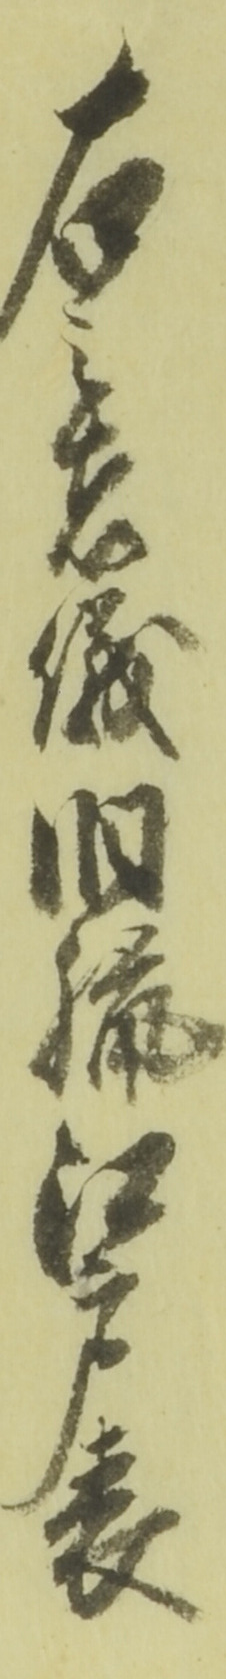右之者儀旧臘江戸表
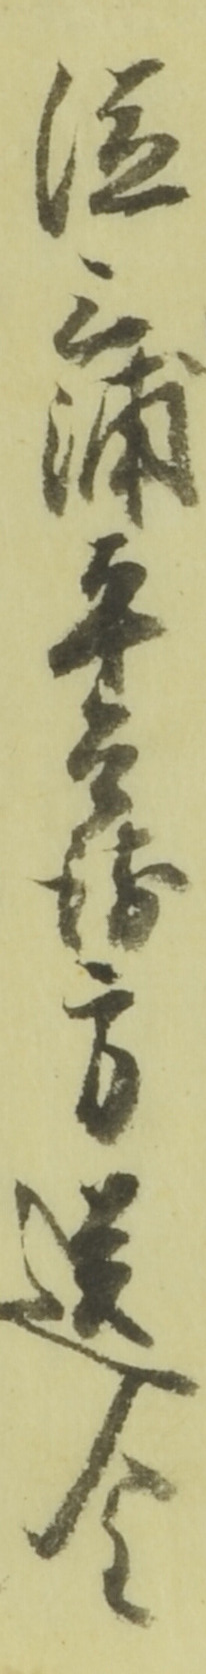従三浦平兵衛方送金
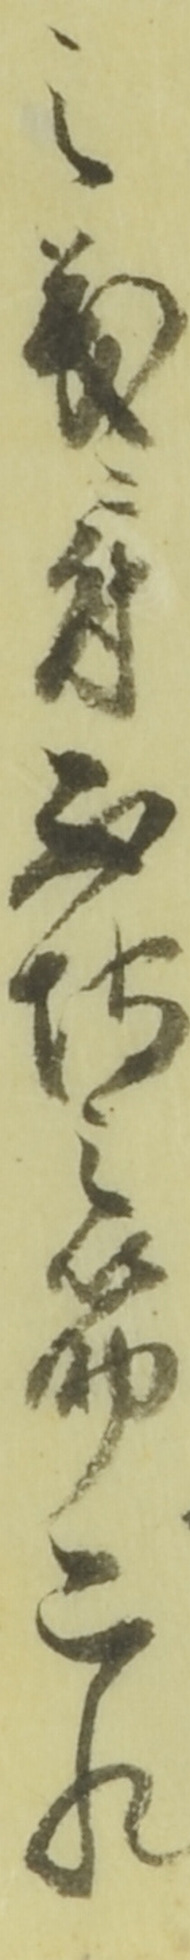之義ニ付不埒之筋これ

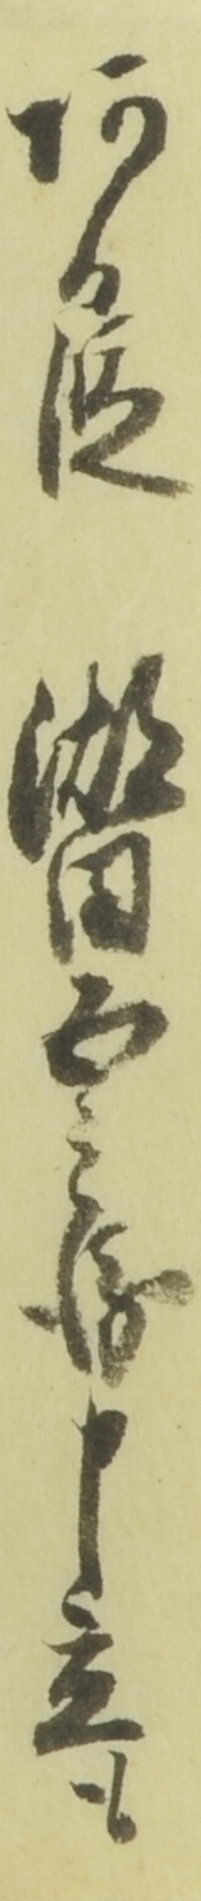ある段湖田五兵衛申立も
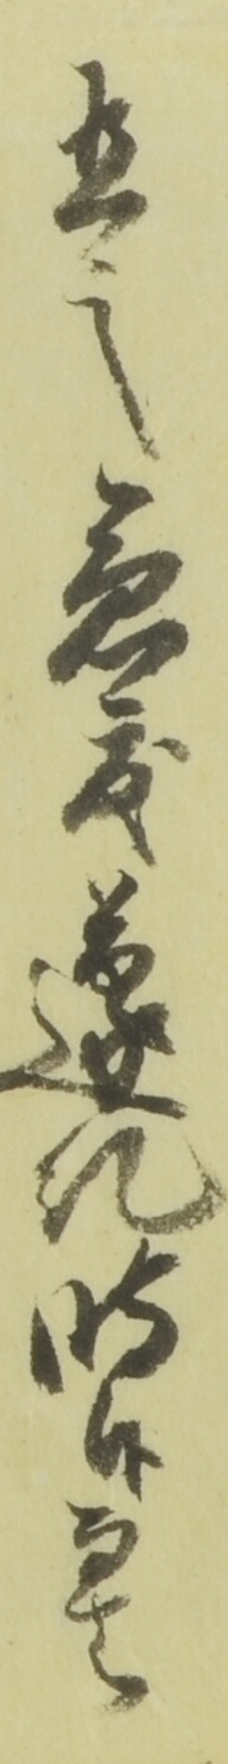有之急度遂糺明候而は
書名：御触書御書附控
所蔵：伊那市立高遠町図書館・合同会社AMANE
